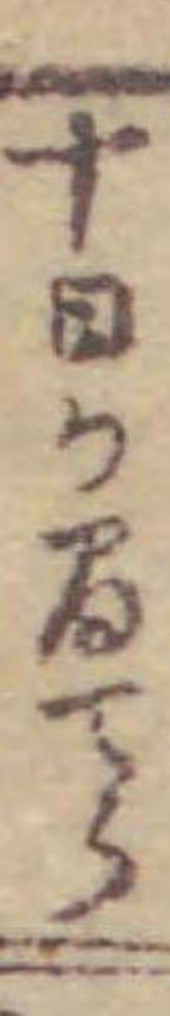十日か間てら
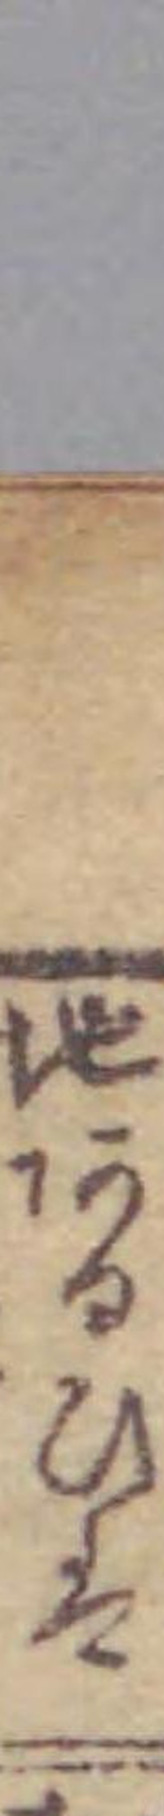地あるひは
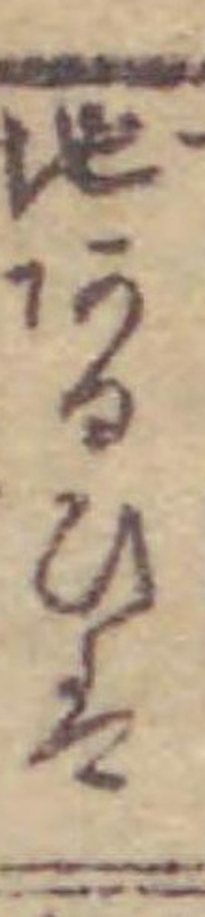地あるひは
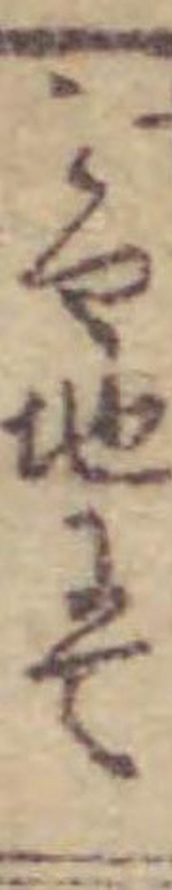みや地にて
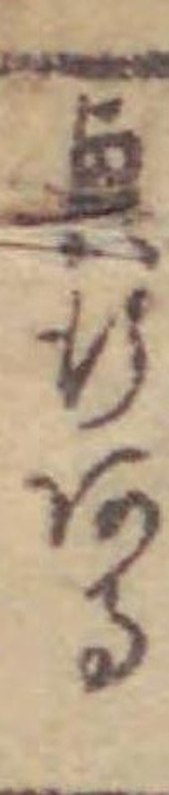興業ある
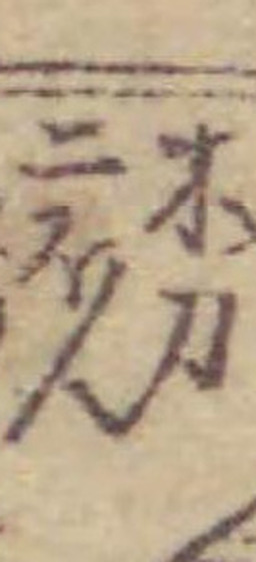二ほん
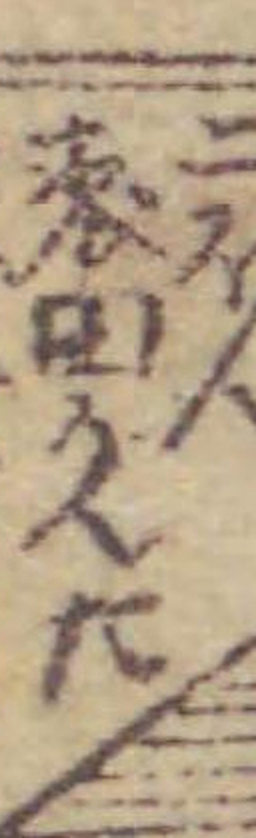森田かんた
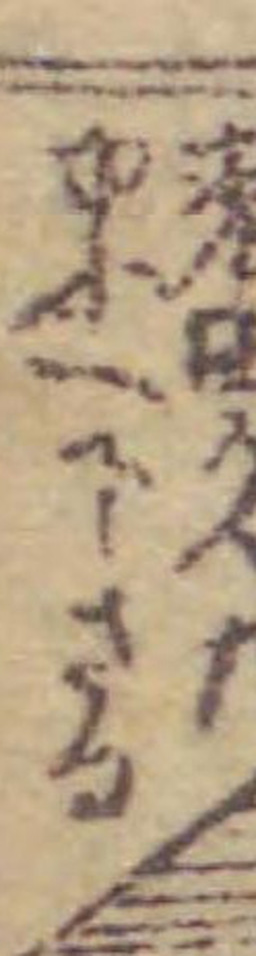ゆふへ下さる

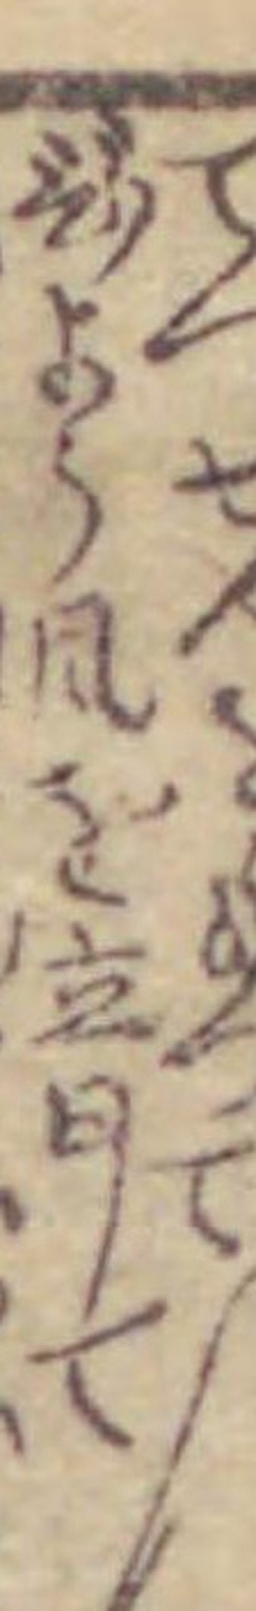びよう風を立回して
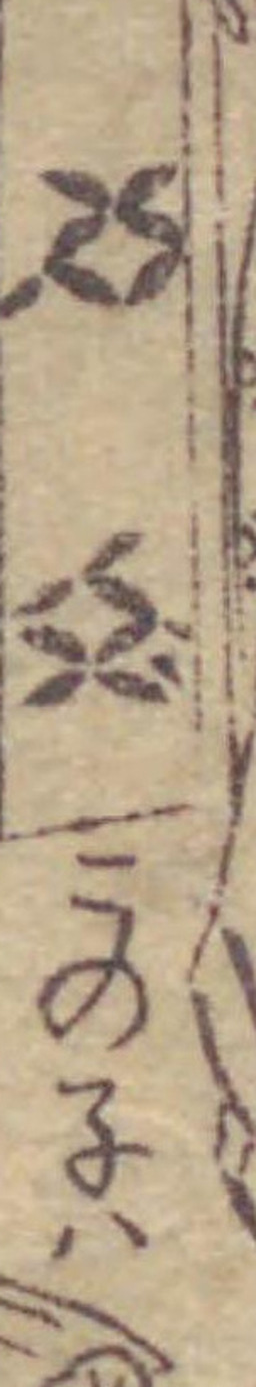この子は
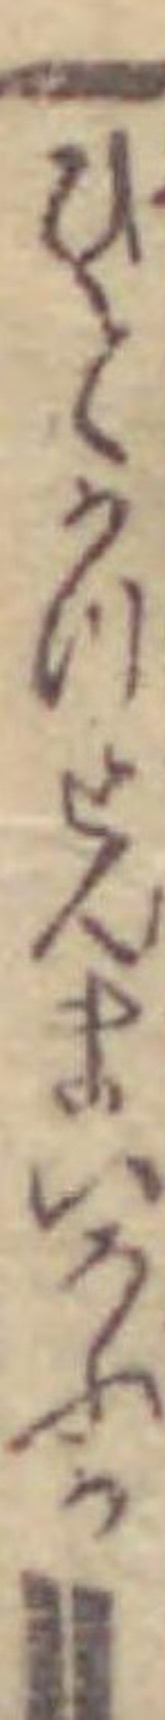ひとかつせんまいろふか
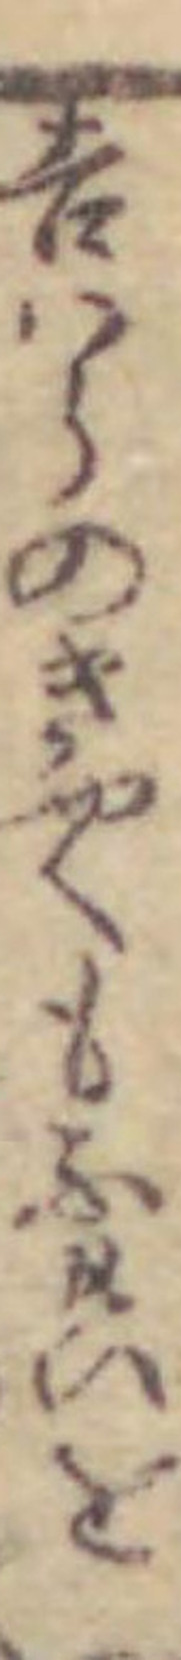吉はらのきやくもふけいを
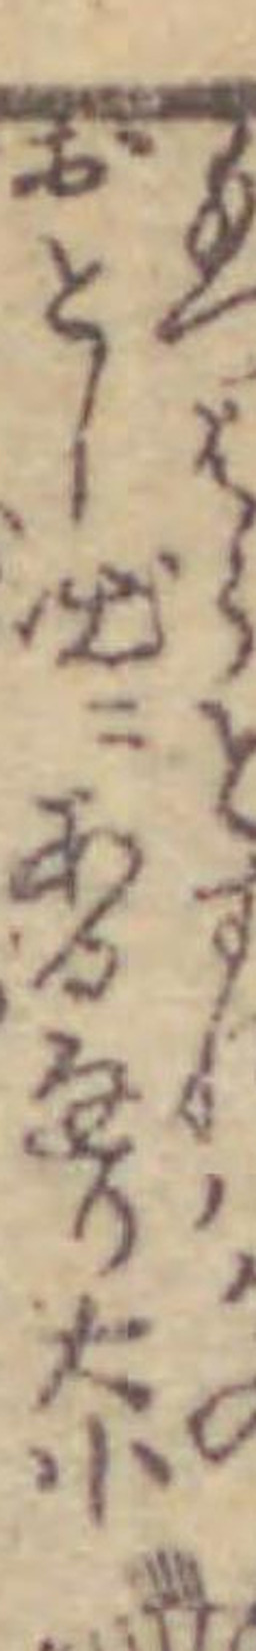おとし咄にある通り大小
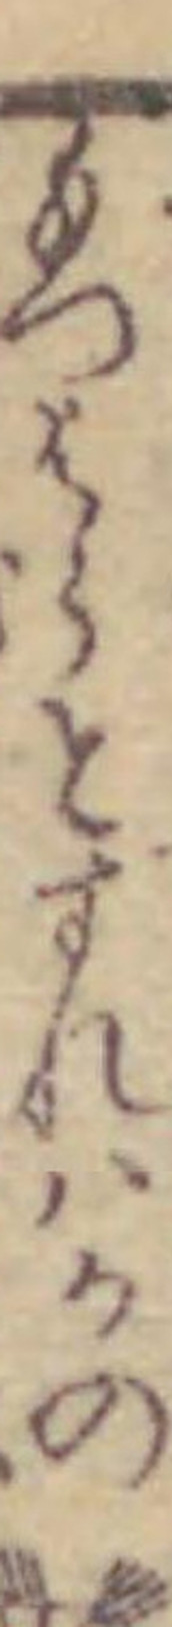もつはらとすれはかの
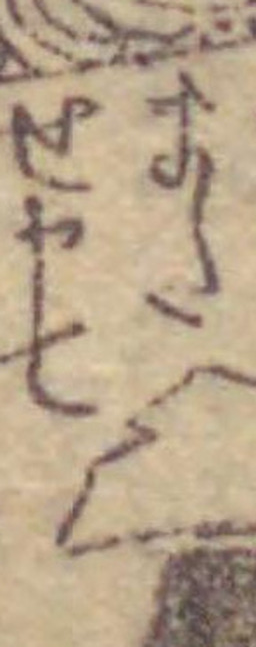せ申て
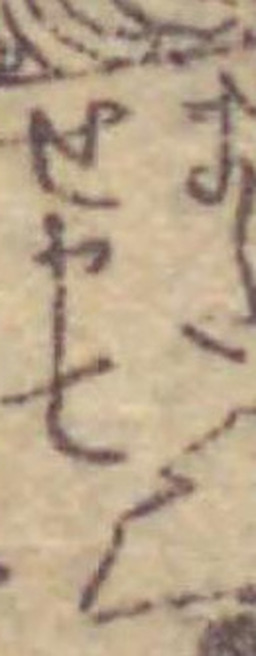せ申て
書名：天下一面鏡梅鉢 : 3巻
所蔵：国立国会図書館 National Diet Library, JAPAN
